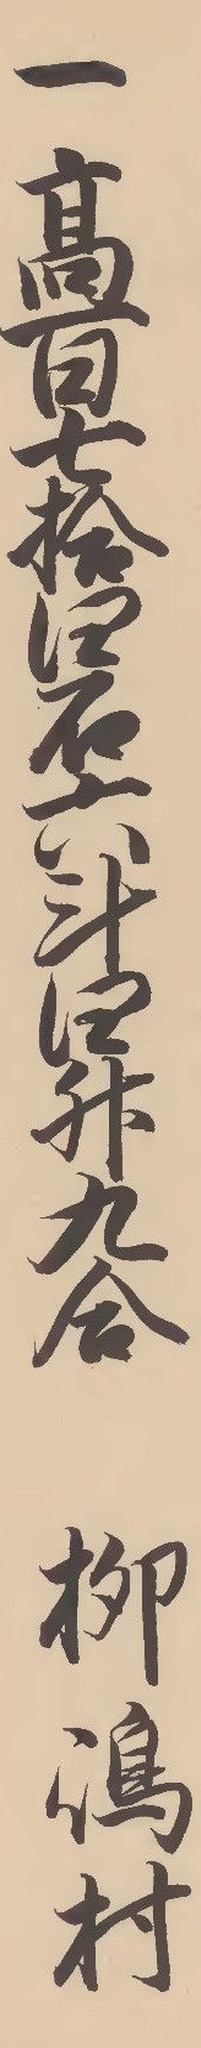一高百七拾四石六斗四升九合柳嶋村
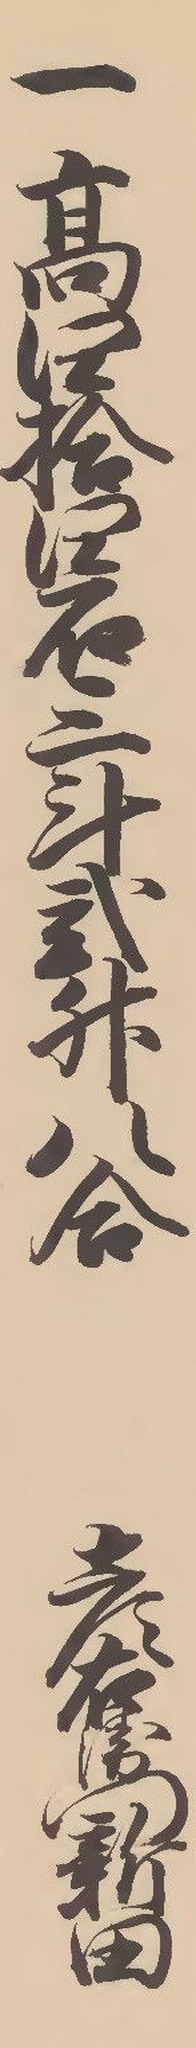一高四拾四石三斗弐升八合彦右衛門新田
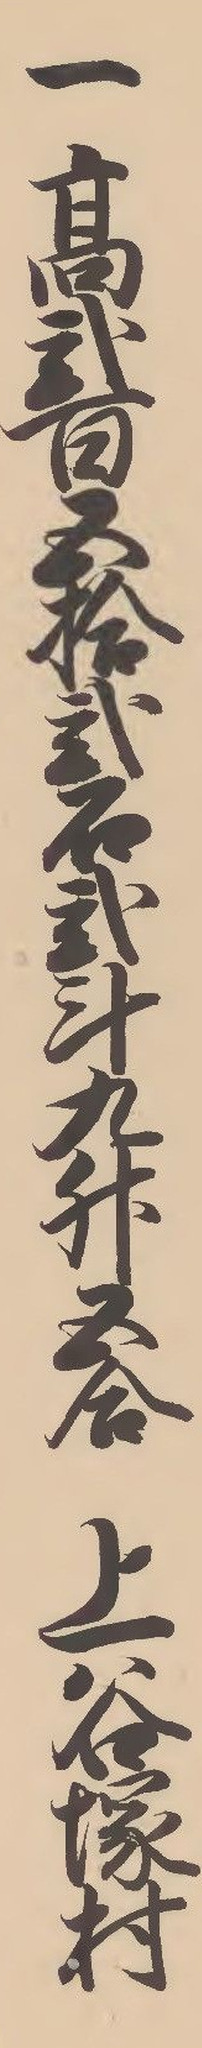一高弐百五拾弐石弐斗九升五合上谷塚村
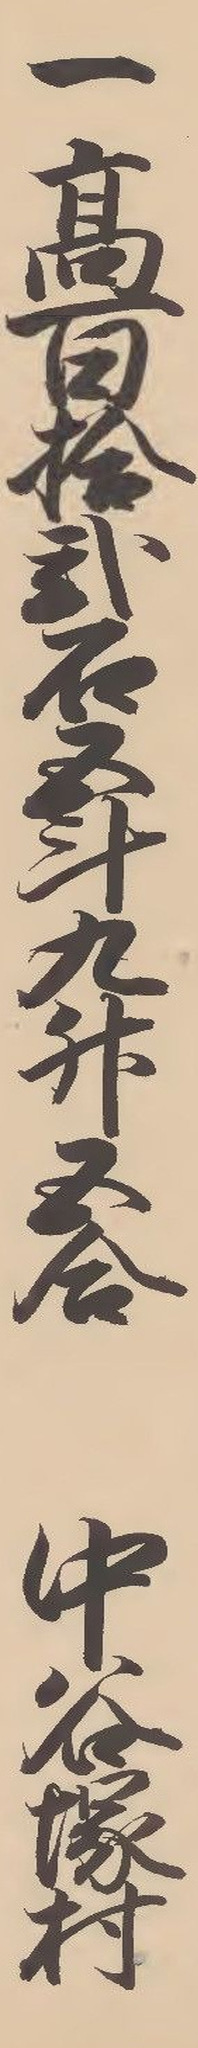一高百拾弐石五斗九升五合中谷塚村
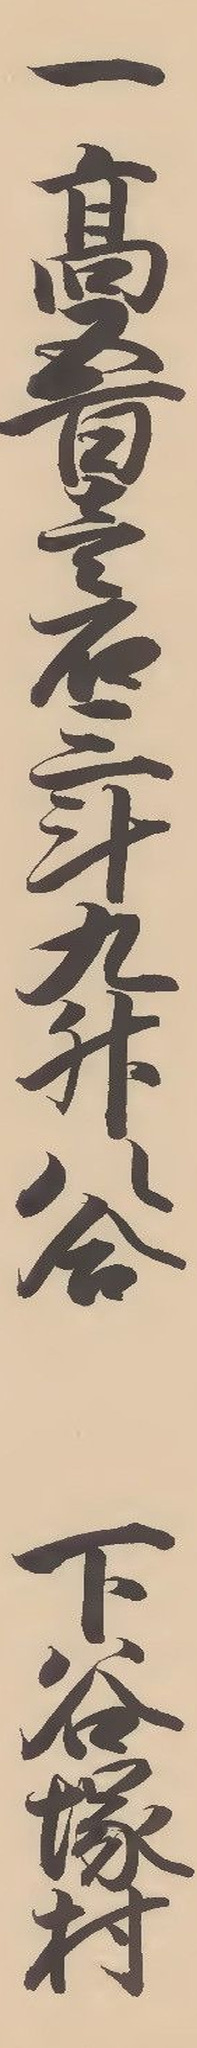一高五百壱石三斗九升八合下谷塚村
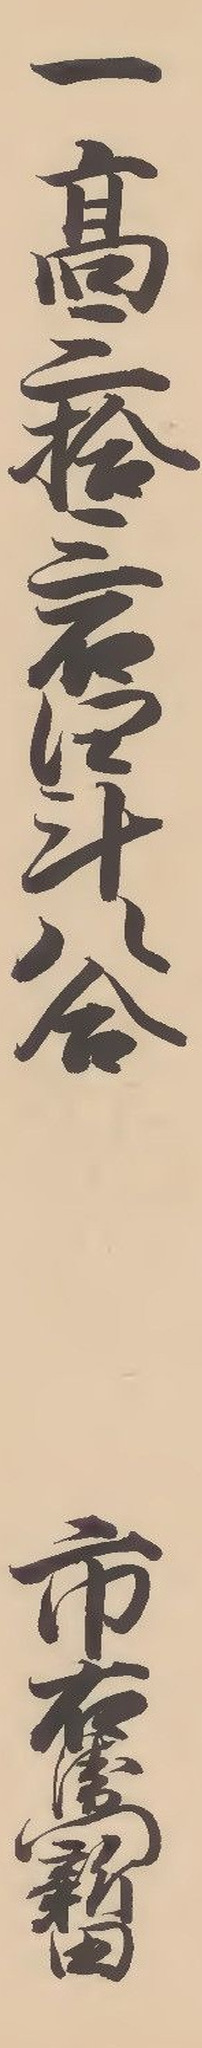一高三拾三石四斗八合市右衛門新田
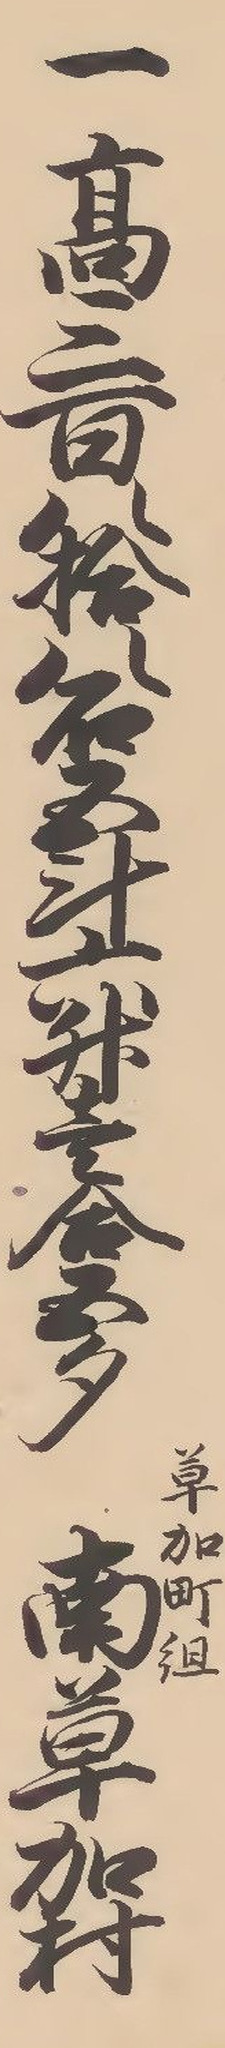一高三百八拾八石五斗六升壱合五勺南草加村

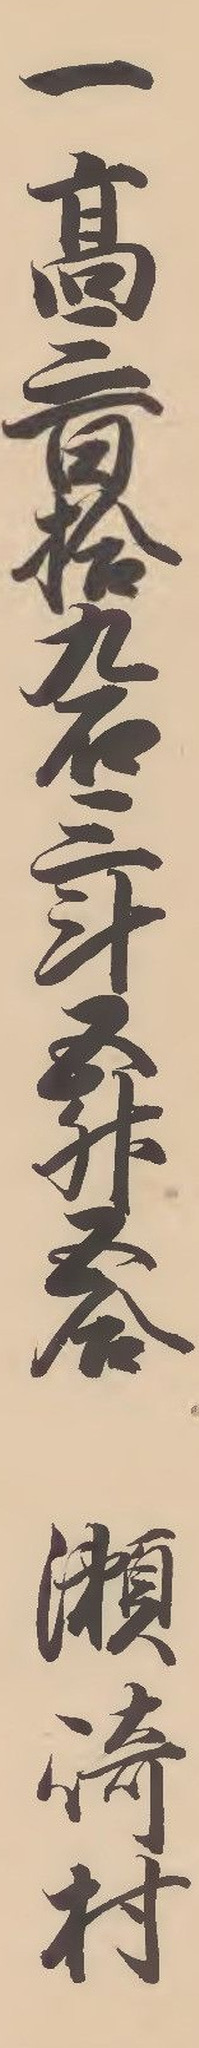一高三百拾九石三斗五升五合瀬崎村
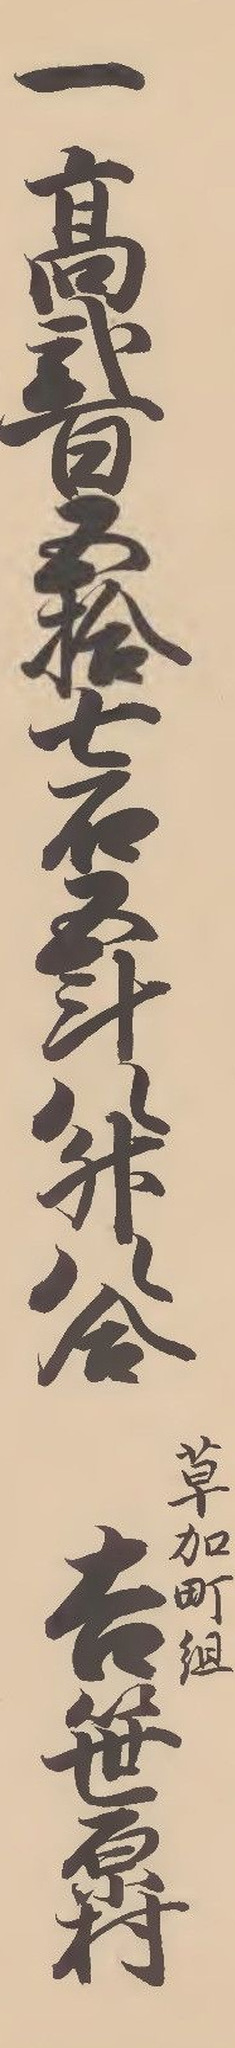一高弐百五拾七石五斗八升八合吉笹原村
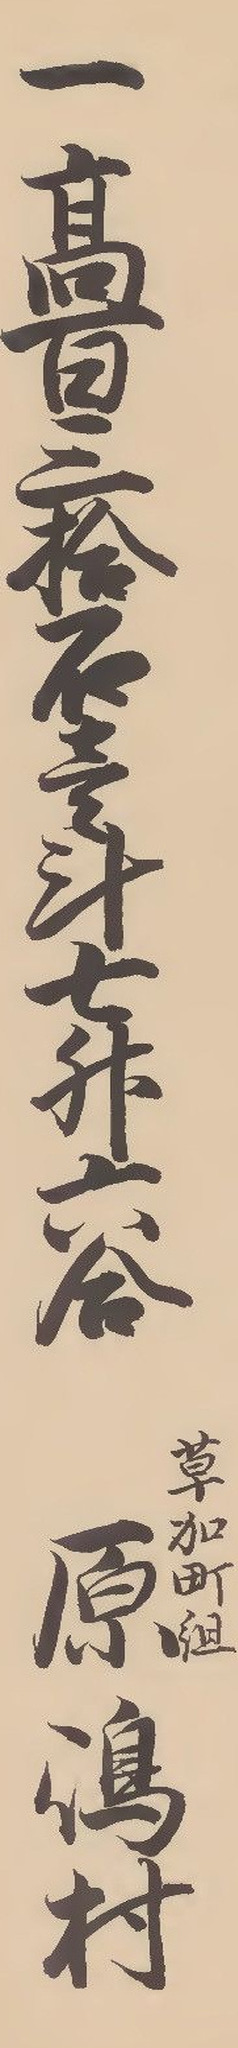一高百三拾石壱斗七升六合原嶋村
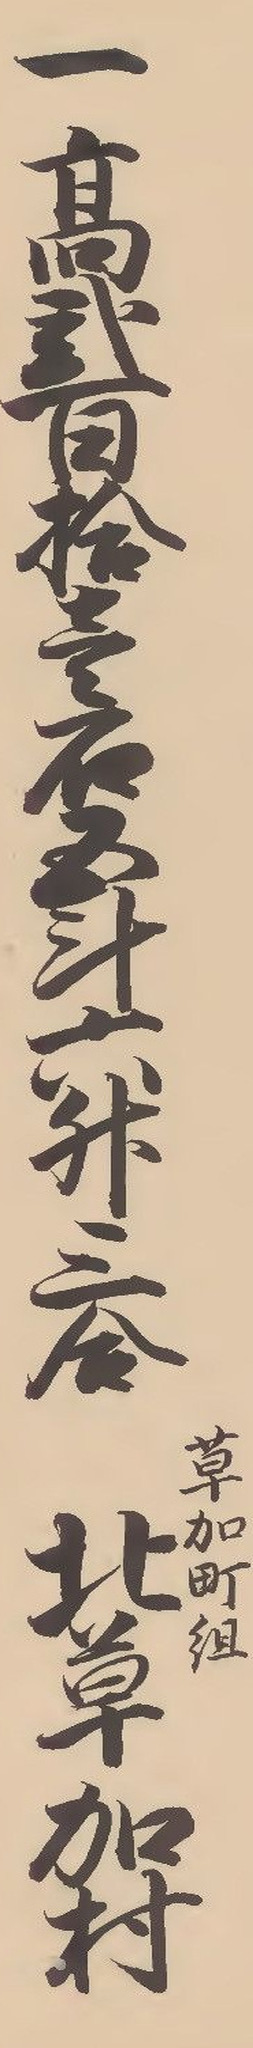一高弐百拾壱石五斗六升三合北草加村
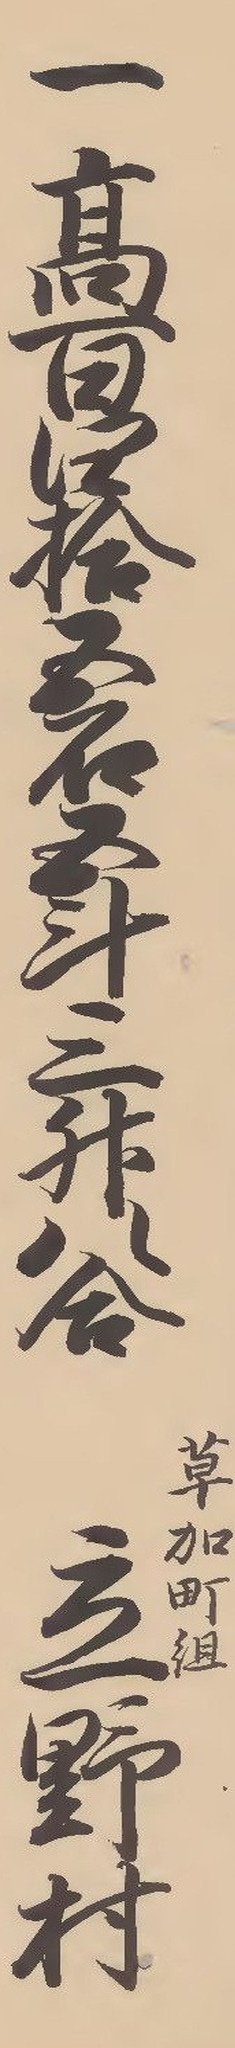一高百四拾五石五斗三升八合立野村
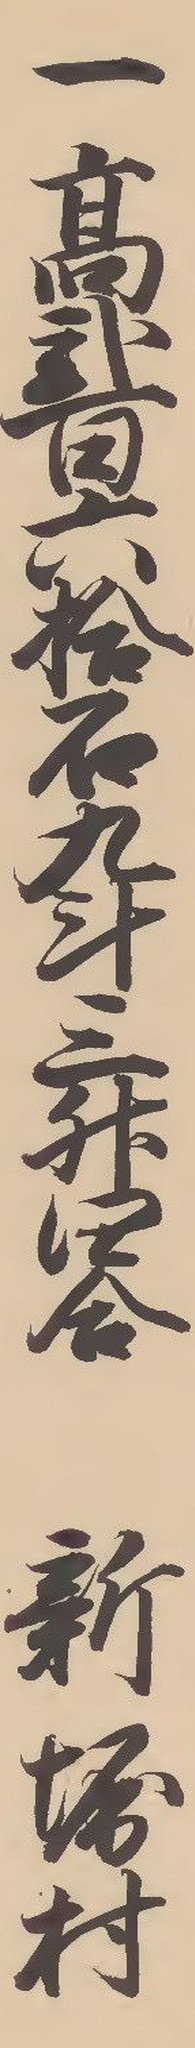一高弐百六拾石九斗三升四合新堀村
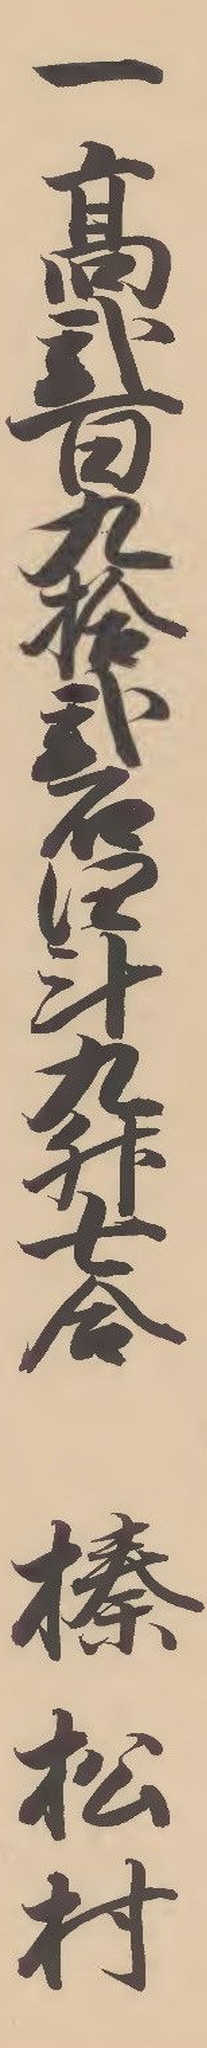一高弐百九拾弐石四斗九升七合榛松村
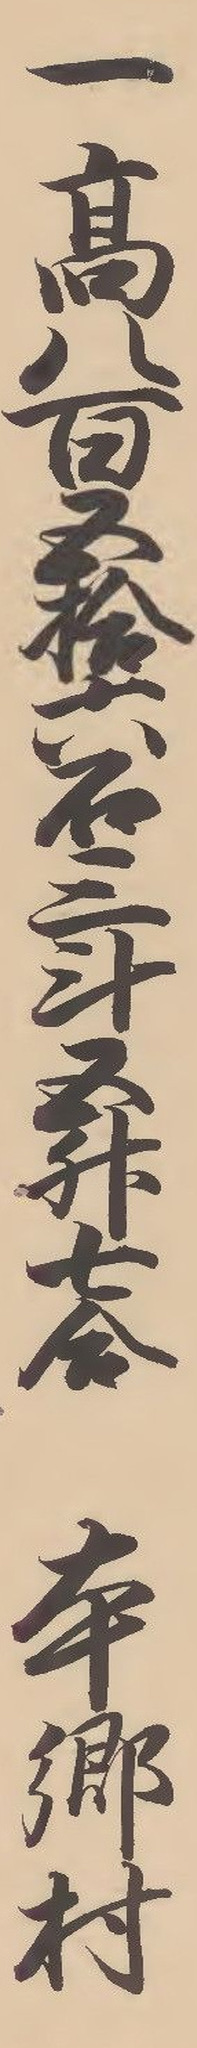一高八百五拾六石三斗五升七合本郷村

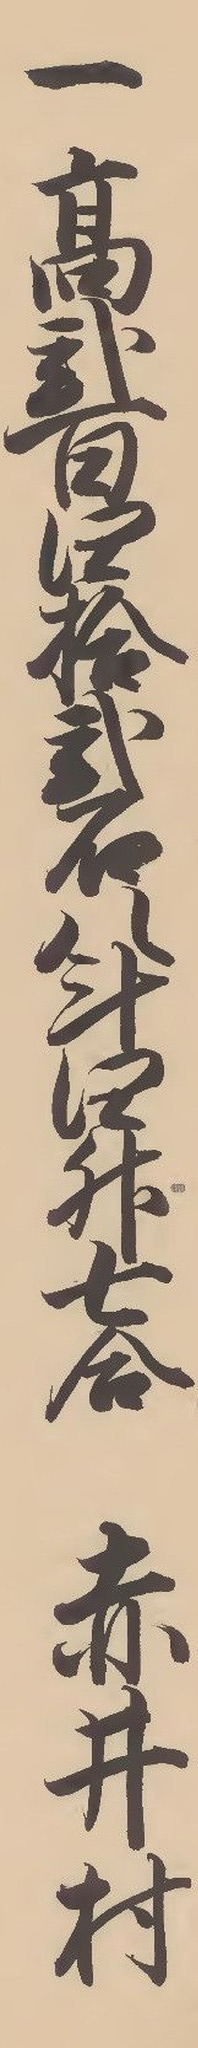一高弐百四拾弐石八斗四升七合赤井村
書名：武蔵国郷帳　下
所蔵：国立公文書館 National Archives of Japan
